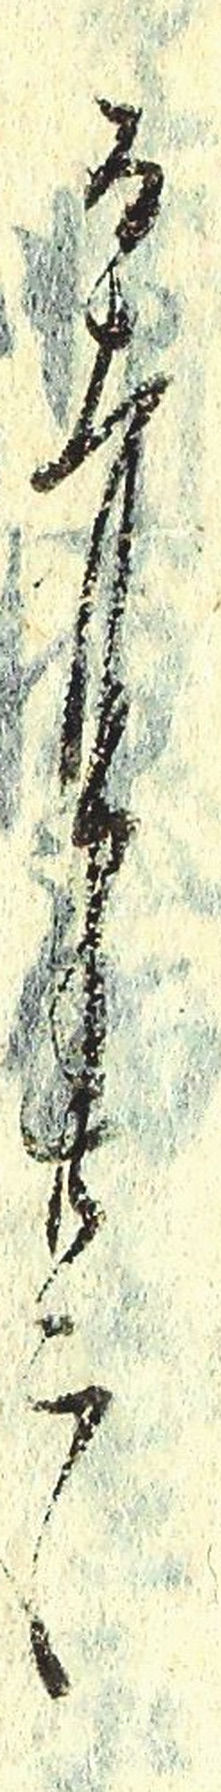酉十一月廿四日
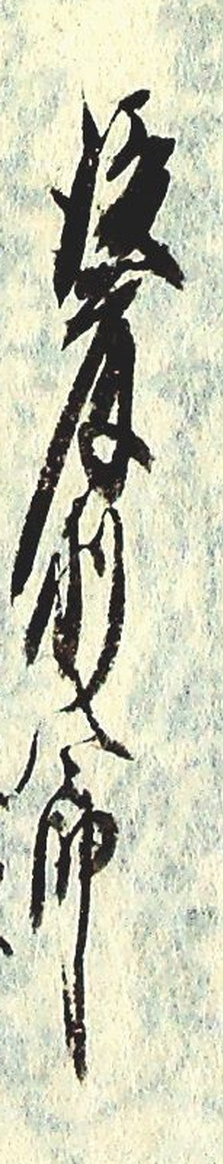後藤利八郎
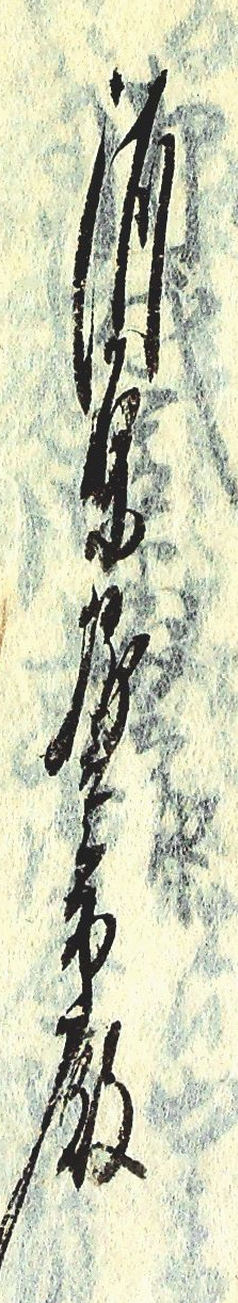河原勝太郎殿
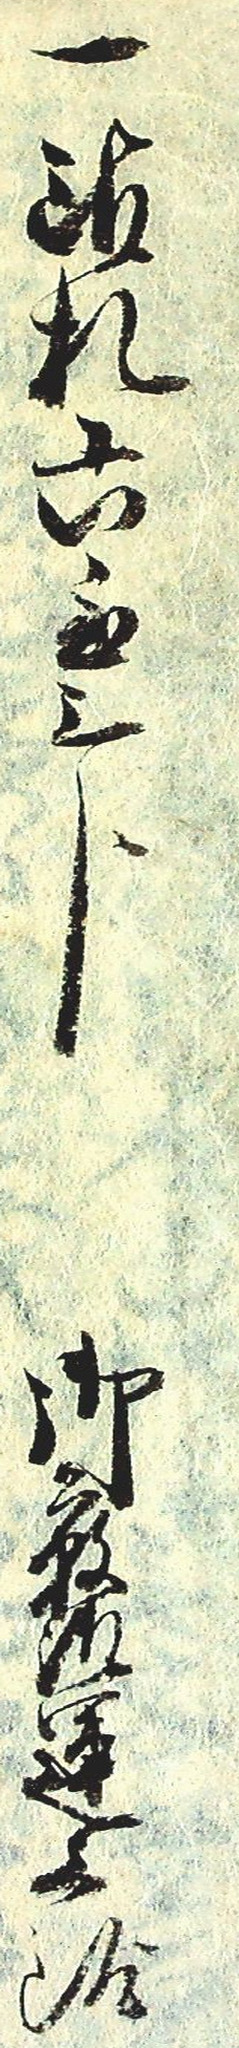一銀札六匁三分御藪御運上銀
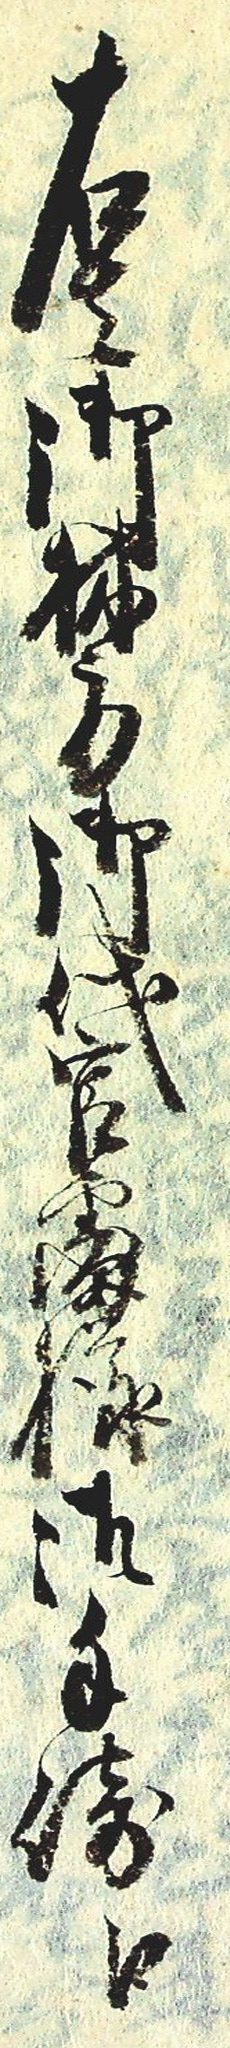右は御林方御代官処様御手崎え
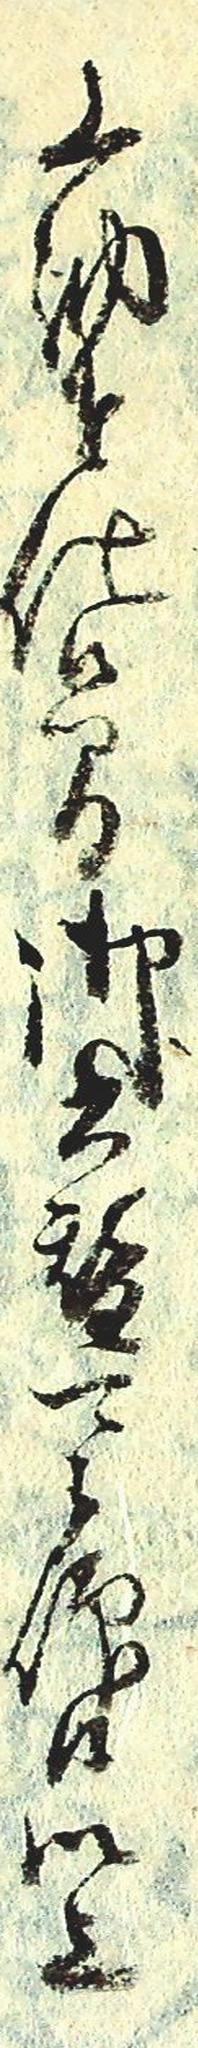上納奉仕候間御書替可被仰候以上
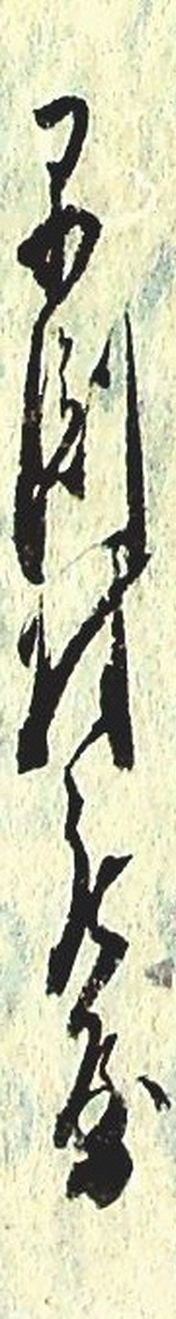早淵村庄屋
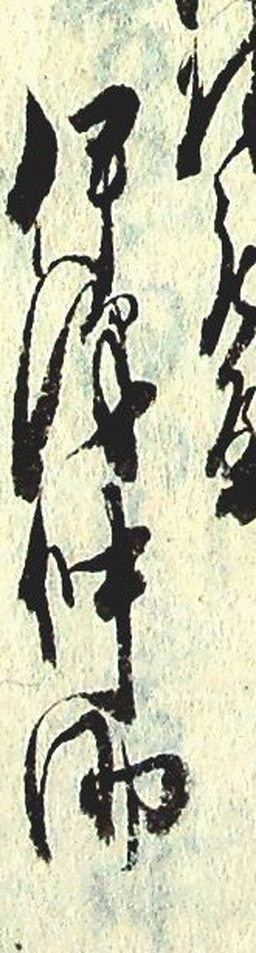伊沢仲助
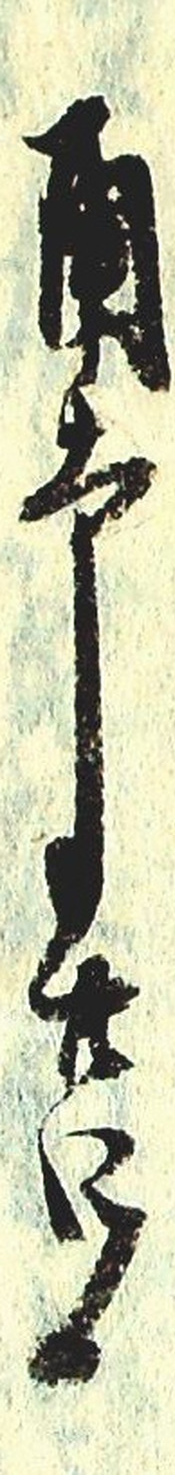酉十一月廿四日
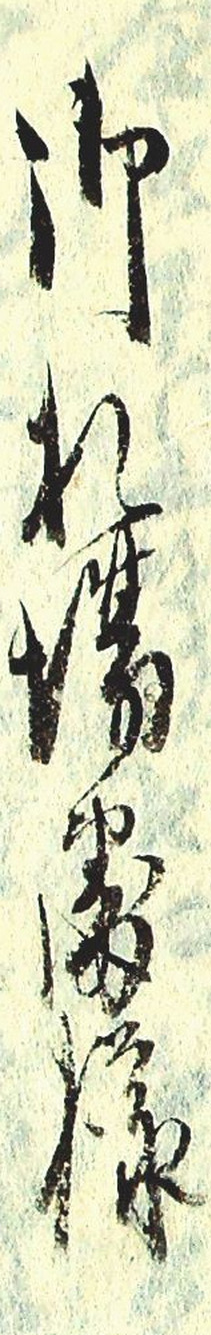御札場処様

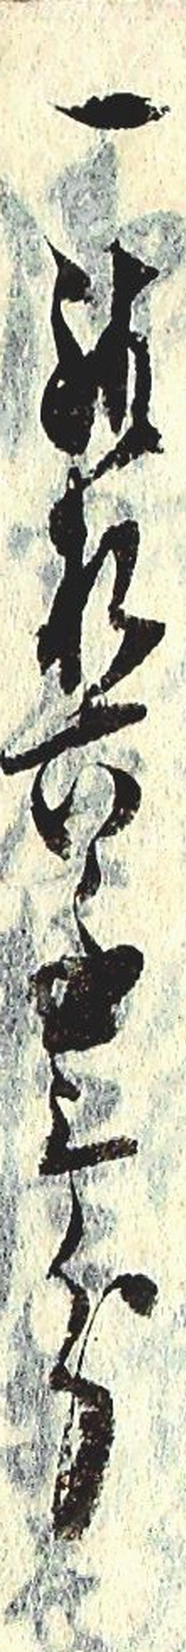一銀札六匁三分
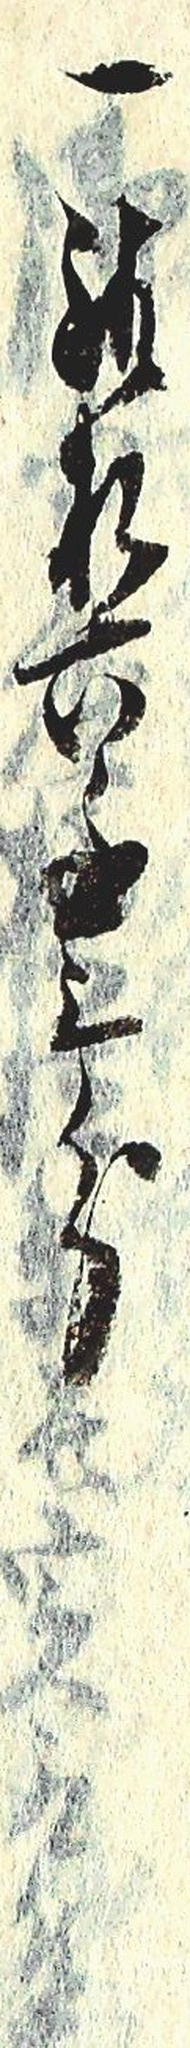一銀札六匁三分
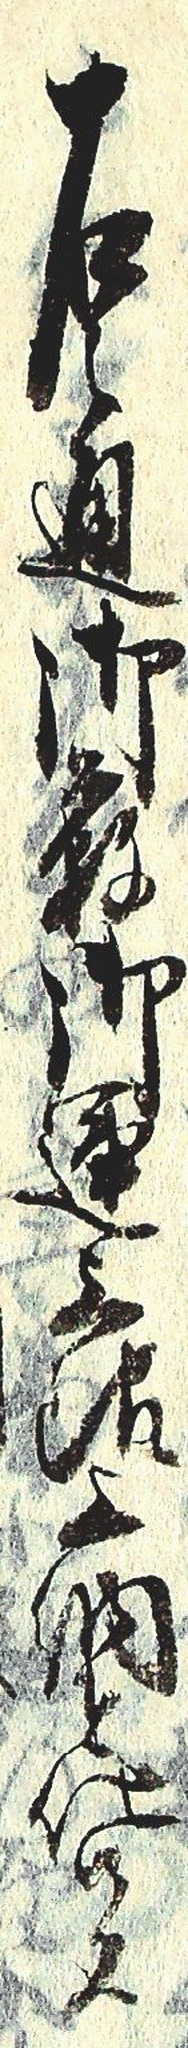右之通御藪御運上銀上納奉仕候以上
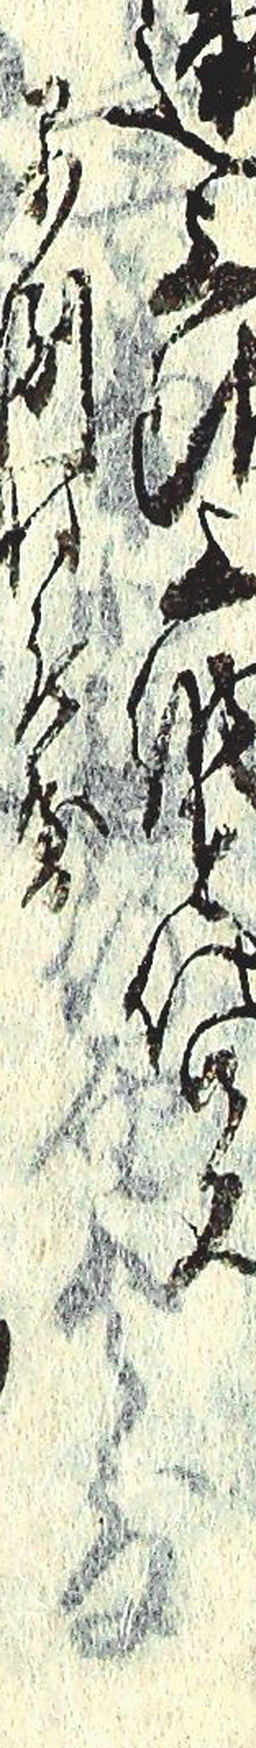早淵村庄屋
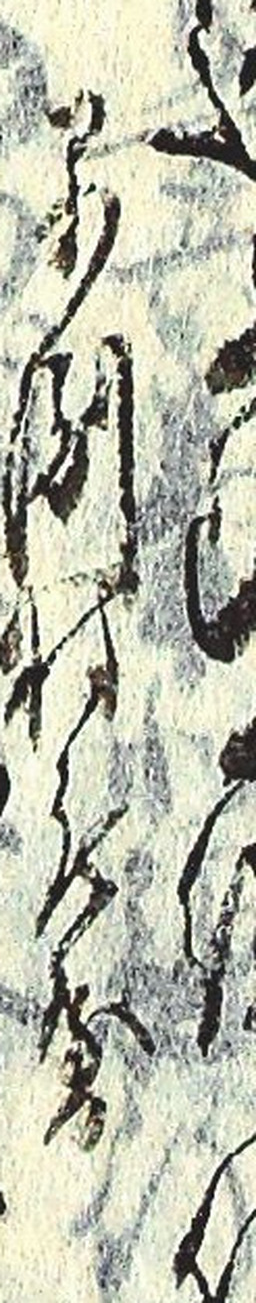早淵村庄屋
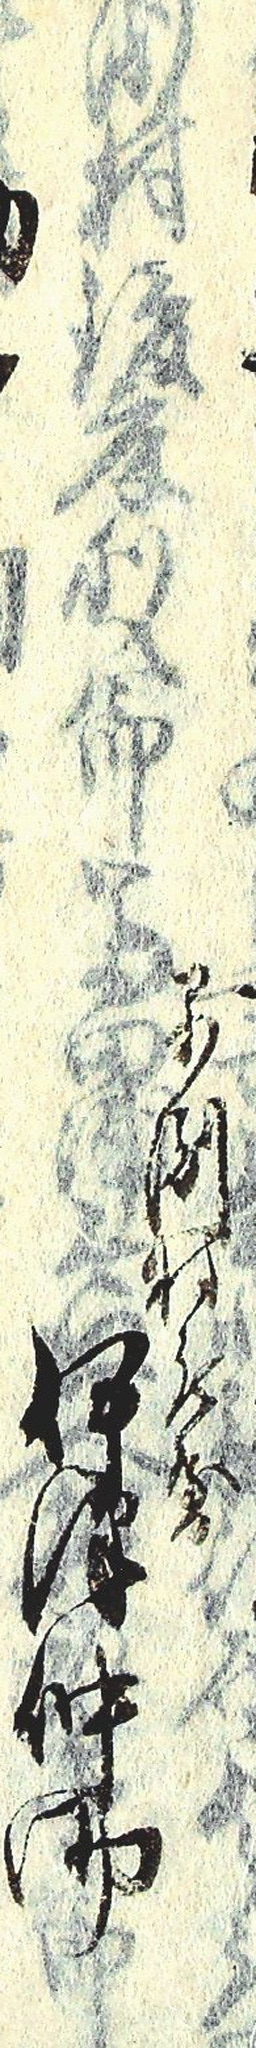伊沢仲助
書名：諸御願書控(弐番）
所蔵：鳴門教育大学 Naruto University of Education
